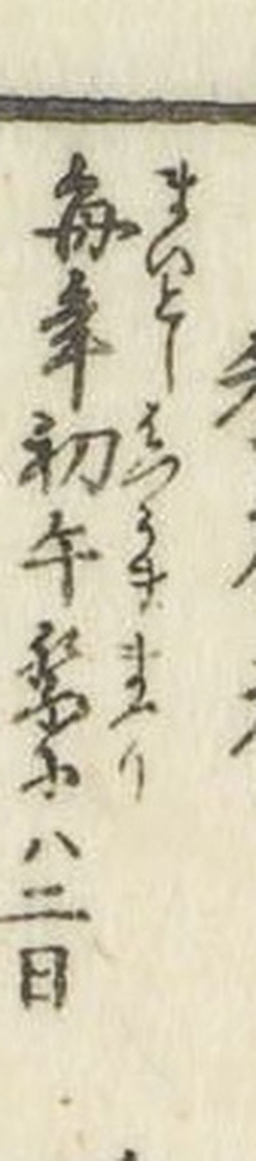毎年初午祭には二日
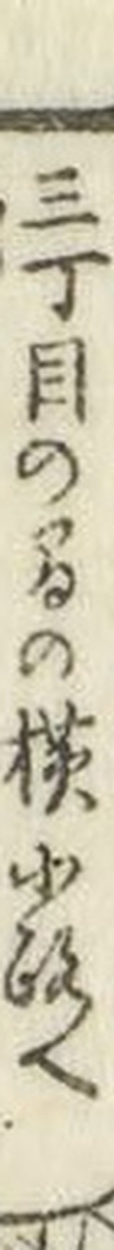三丁目の間の横小路へ
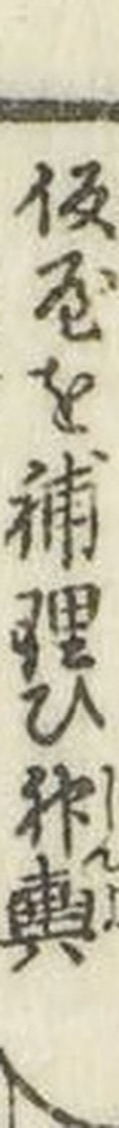仮屋を補理ひ神輿
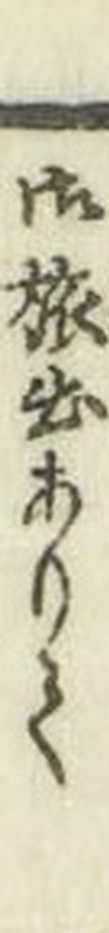御旅出ありて
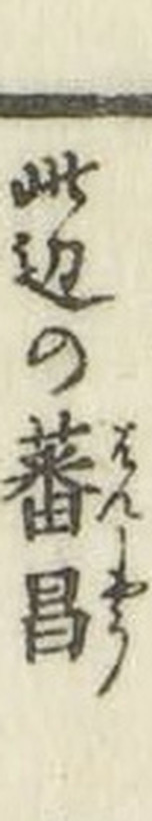此辺の蕃昌
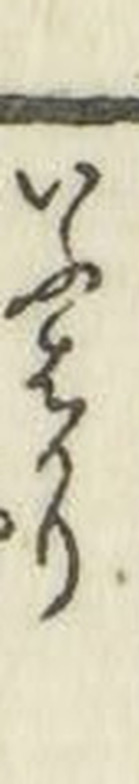いふはかり

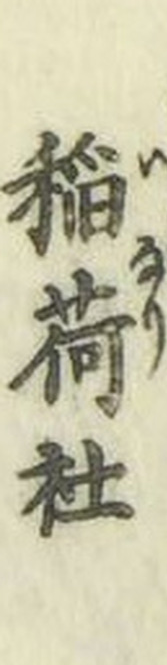稲荷社
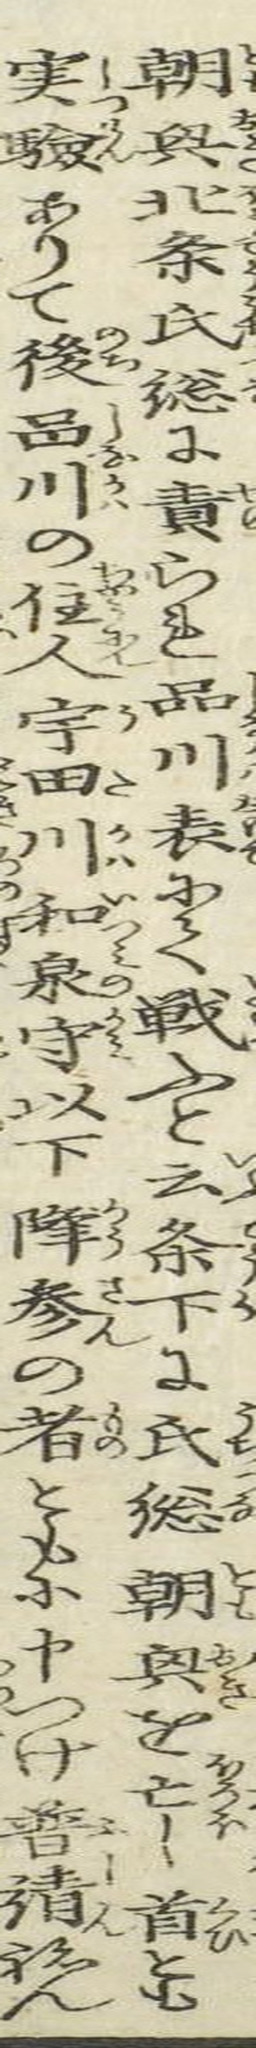実験ありて後品川の住人宇田川和泉守以下降参の者ともに申つけ普請ねん
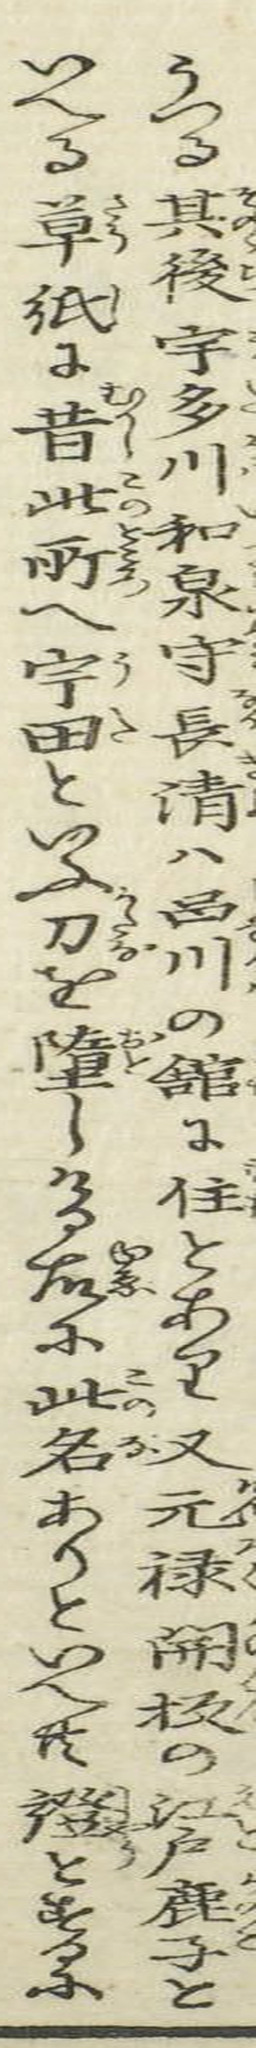いへる草紙に昔此所へ宇田といふ刀を堕しける故に此名ありといへ共證とするにたらす
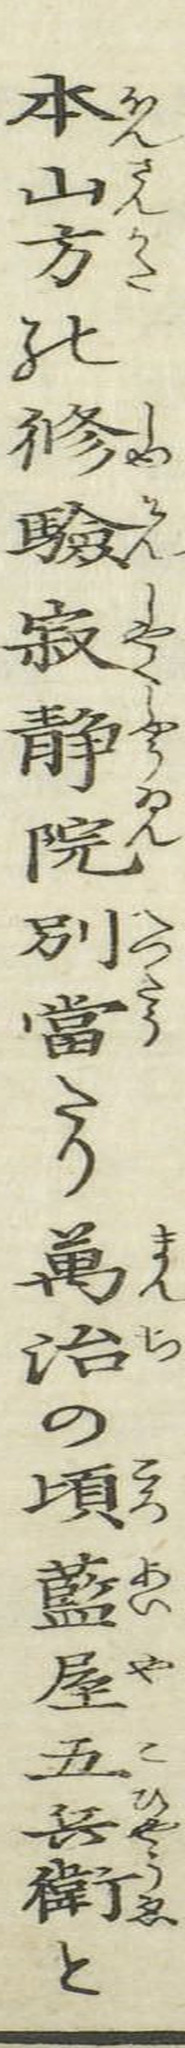本山方の修験寂静院別當たり萬治の頃藍屋五兵衛と
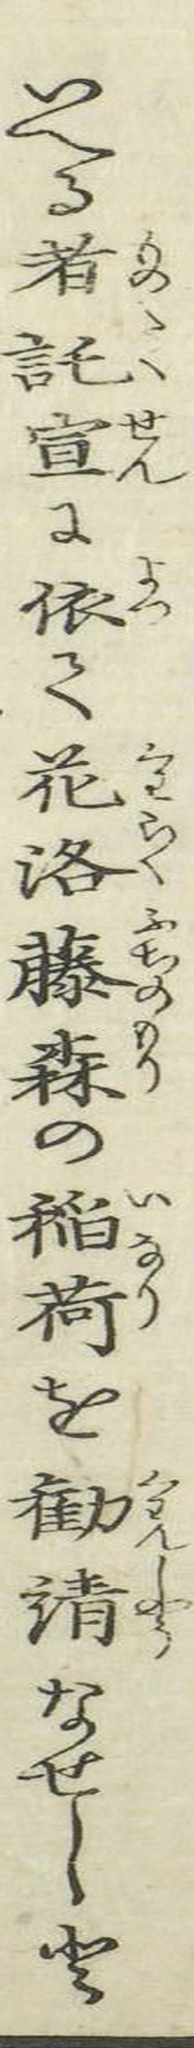いへる者託宣に依て花洛藤森の稲荷を勧請なせしと
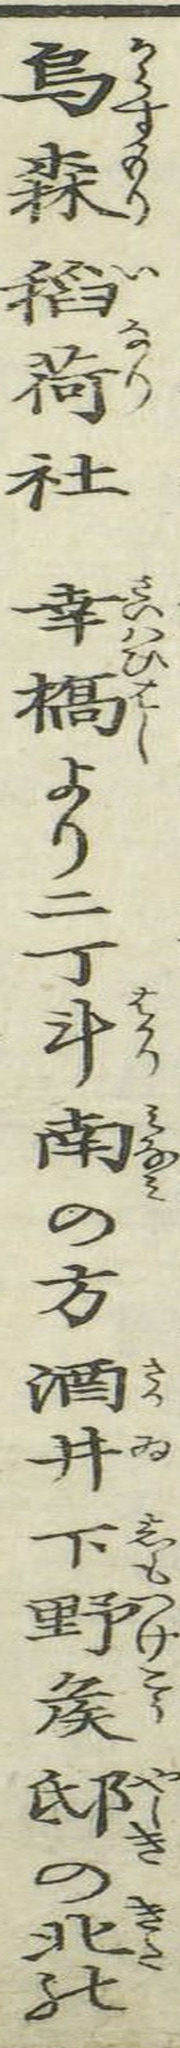烏森稲荷社幸橋より二丁斗南の方酒井下野侯邸の北の
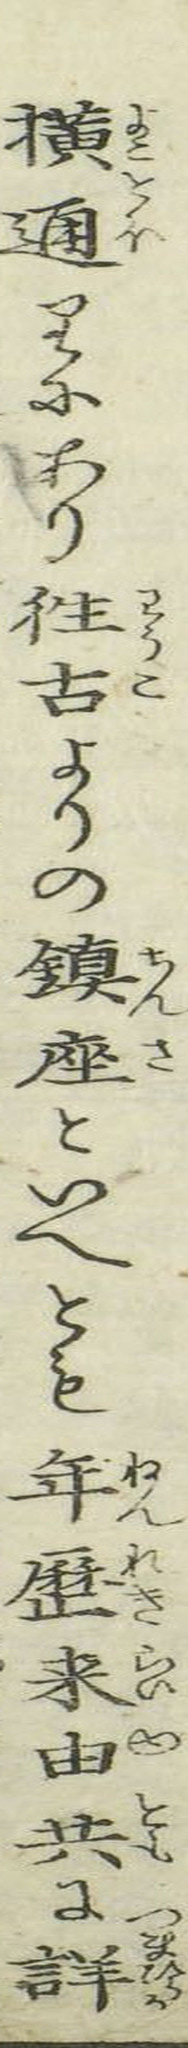横通りにあり往古よりの鎮座といへとも年暦来由共に詳

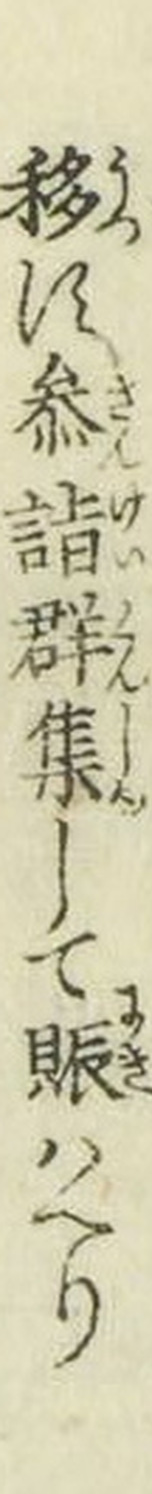移す参詣群集して賑はへり
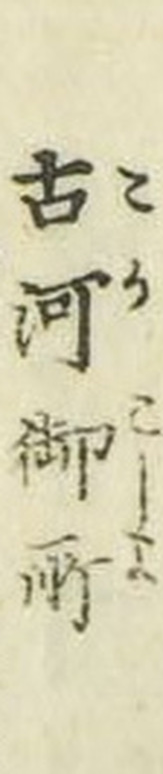古河御所
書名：江戸名所図会 20巻 巻之3
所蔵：東京学芸大学教育コンテンツアーカイブ
